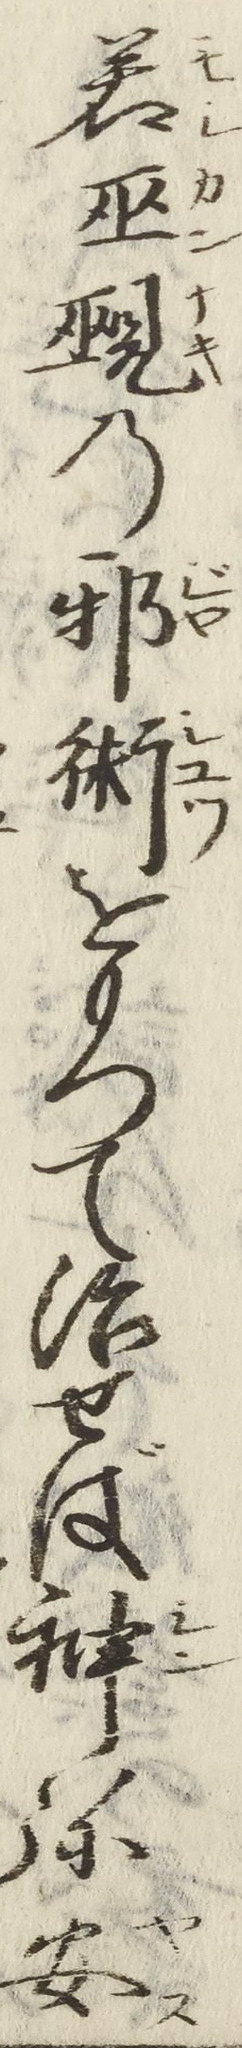若巫覡の邪術をもつて治せば神弥安
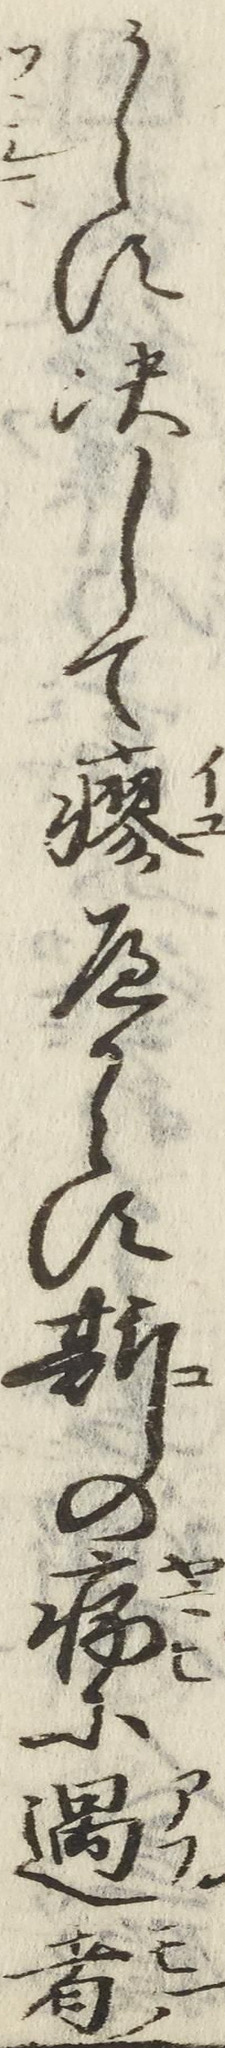からす決して瘳へからす斯の病に遇者
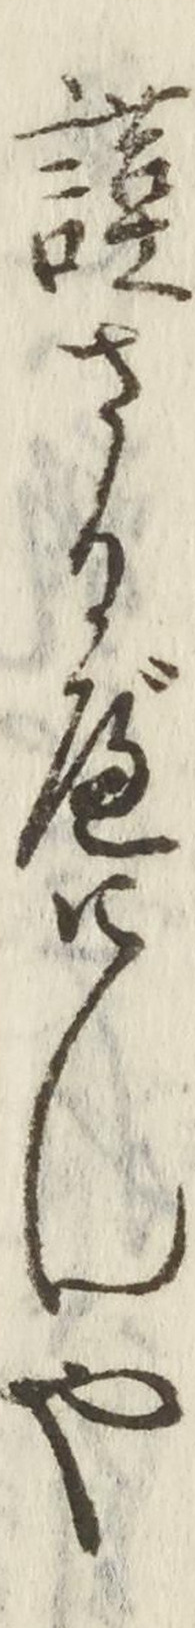謹さるべけんや
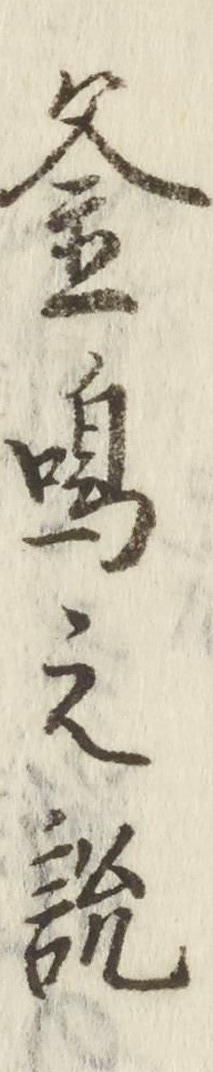釜鳴之説
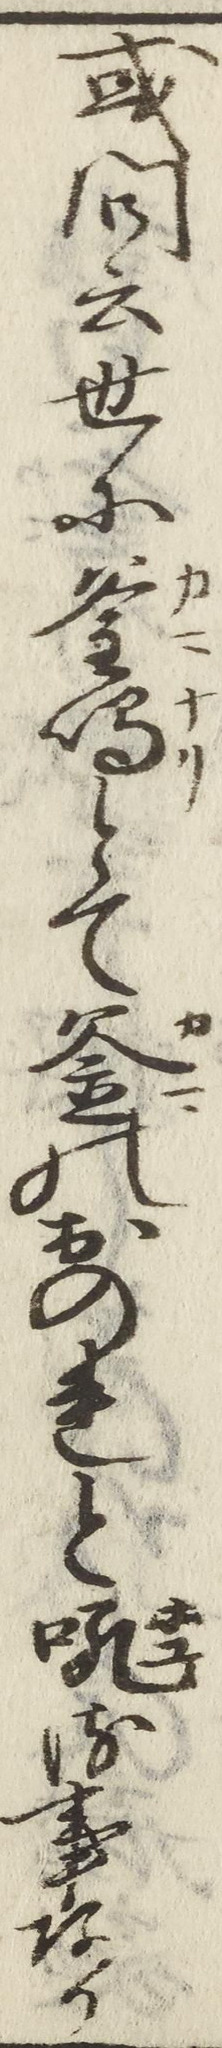或問云世に釜鳴とて釜のおのれと吼る事あり
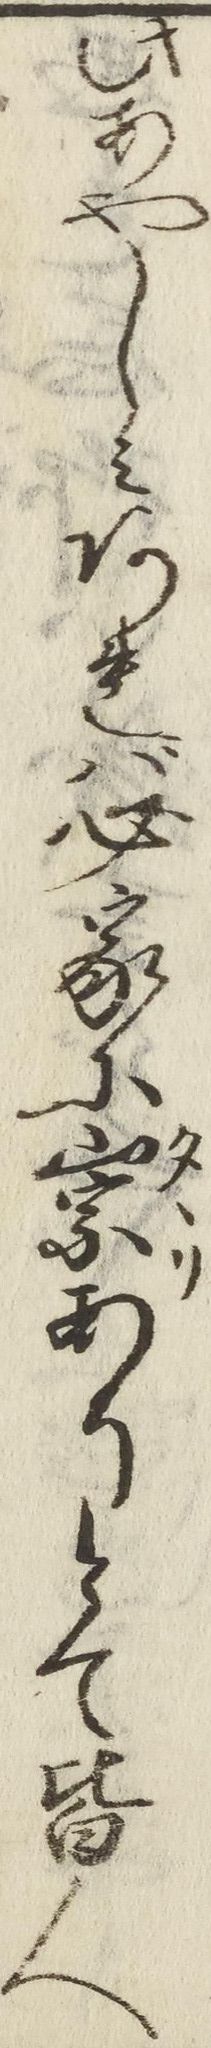此あやしみあれば必家に祟ありとて皆人

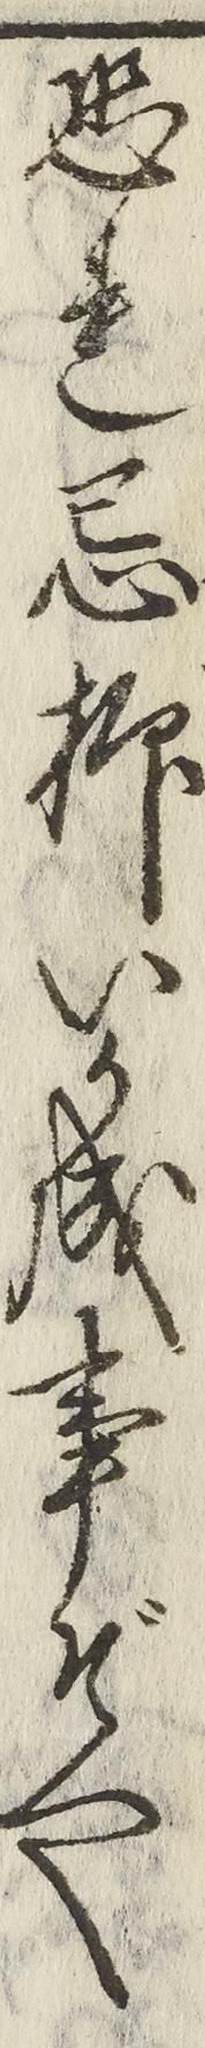恐れ忌抑いか成事ぞや
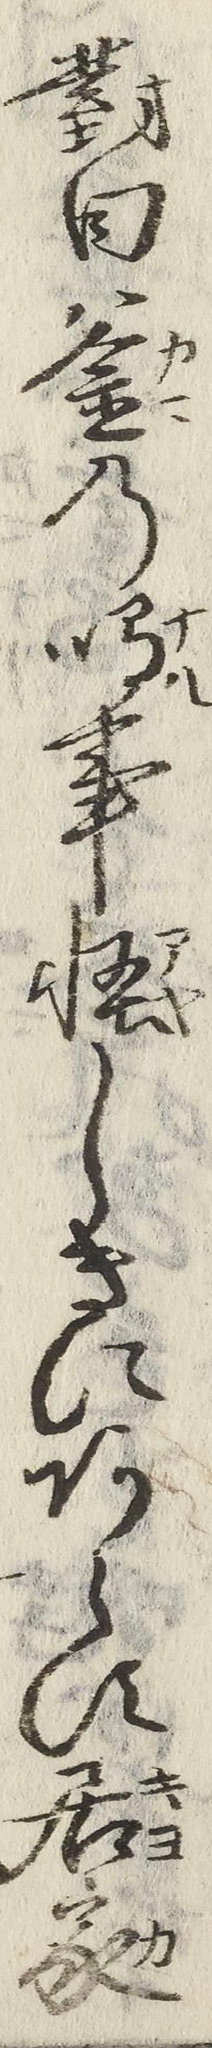対曰釜の鳴事怪しきにあらす居家
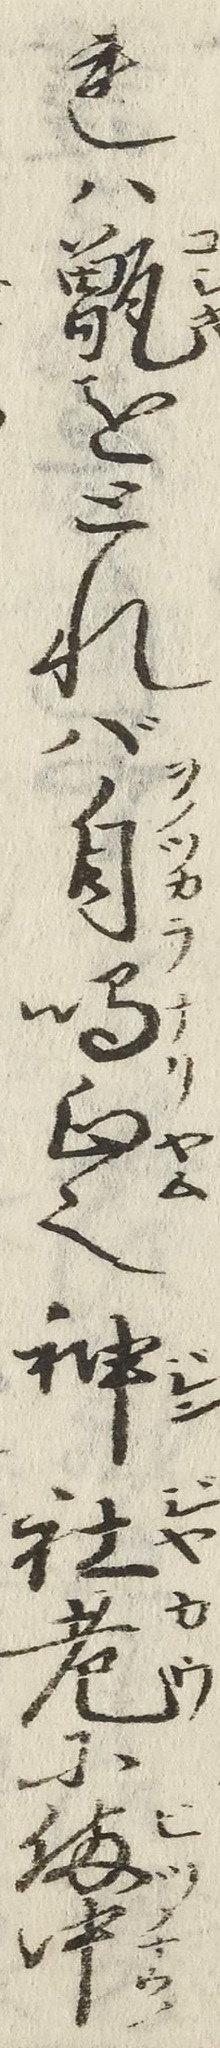れは甑をとれば自鳴止也神社老に備中
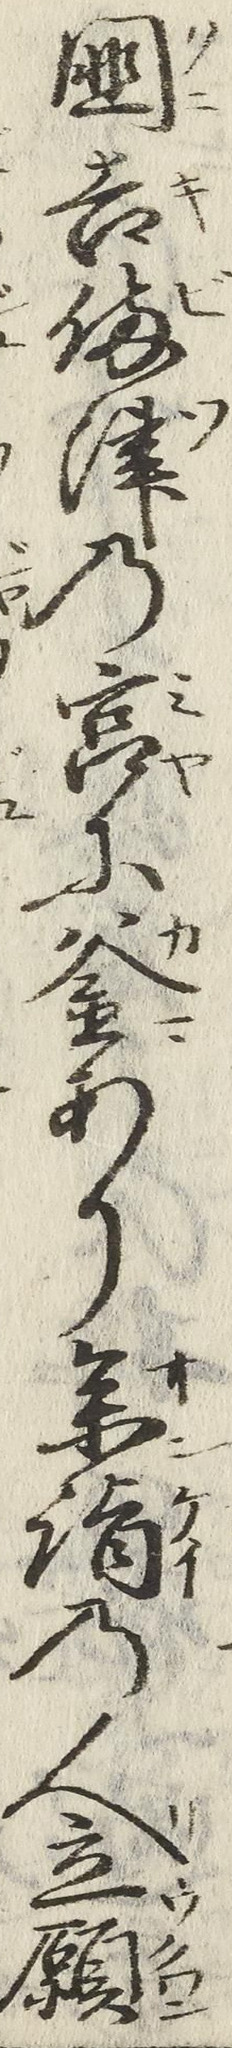国吉備津の宮に釜あり参詣の人立願
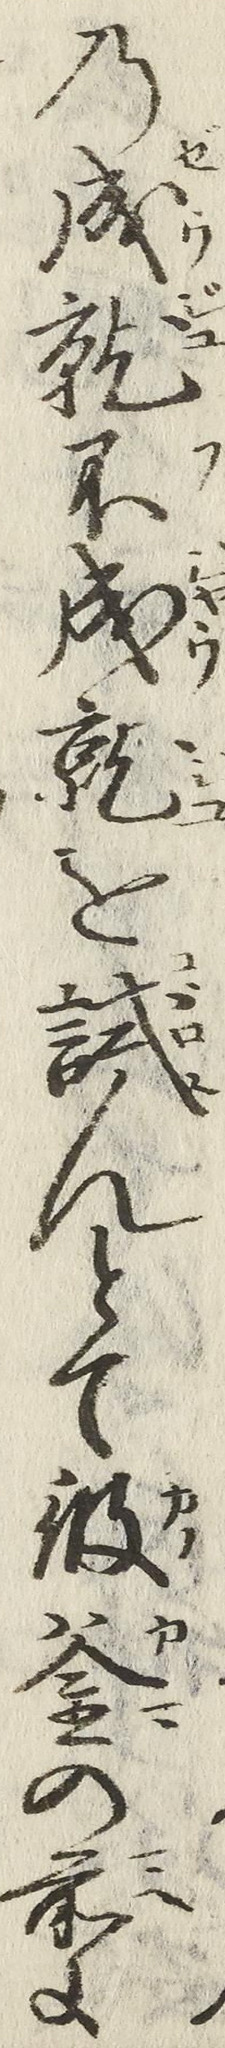の成就不就を試んとて彼釜の前に
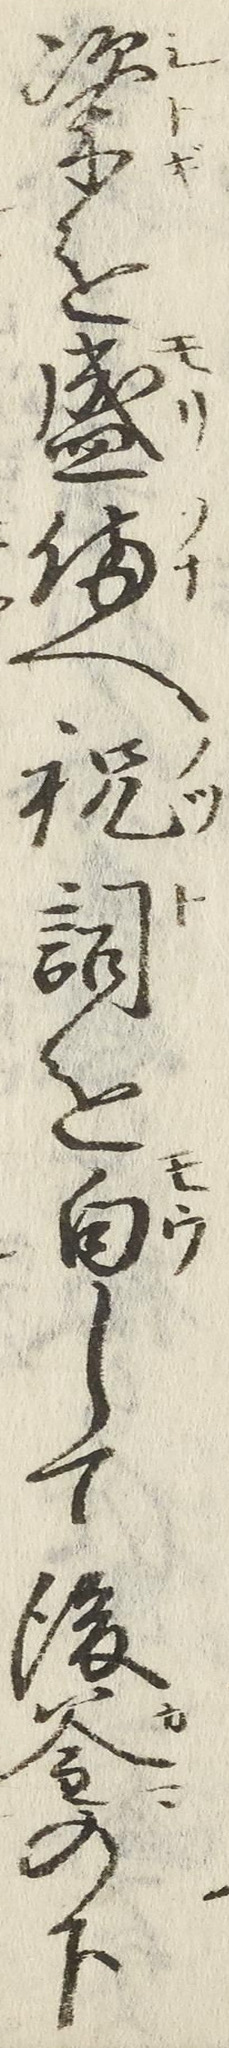粢を盛備へ祝詞を白して後釜の下
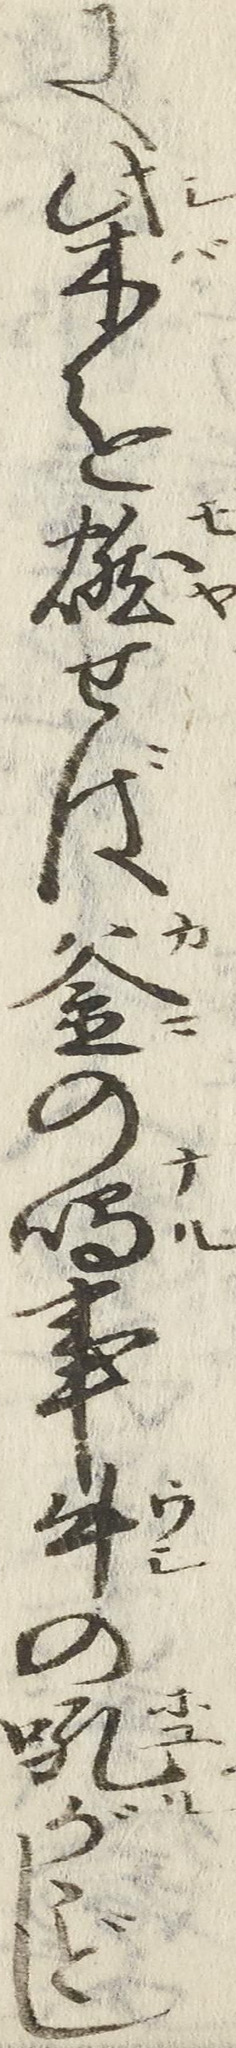に柴を燃せば釜の鳴事牛の吼がごとし
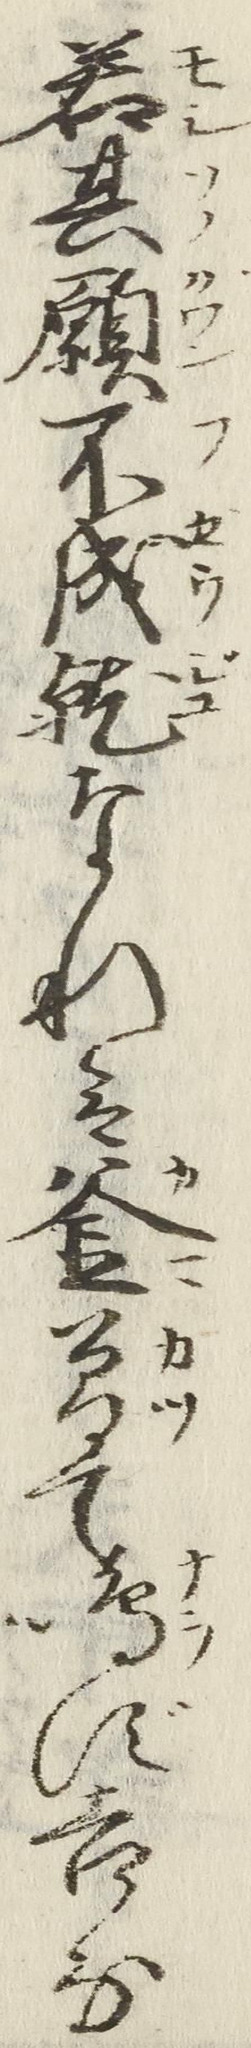若其願不成就なれは釜曽て鳴ず吉な
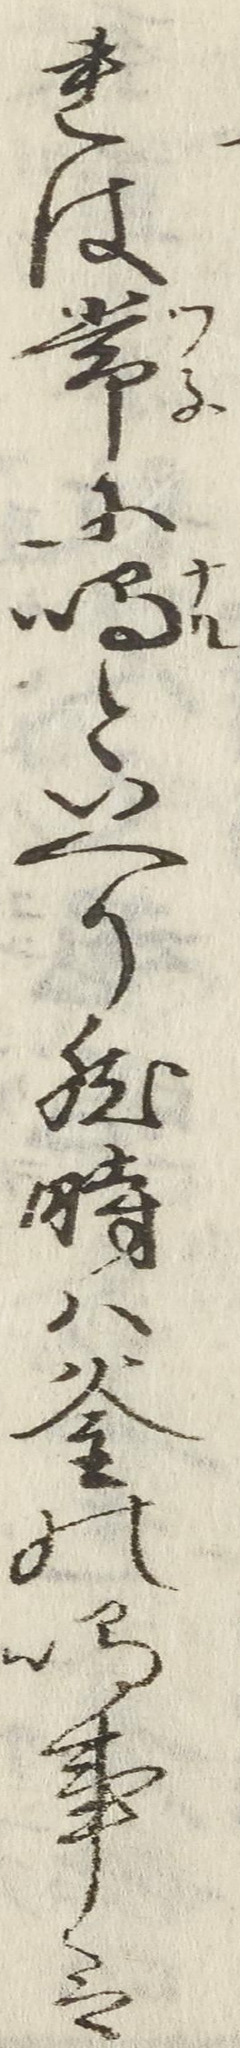れは常に鳴といへり然時は釜の鳴事は
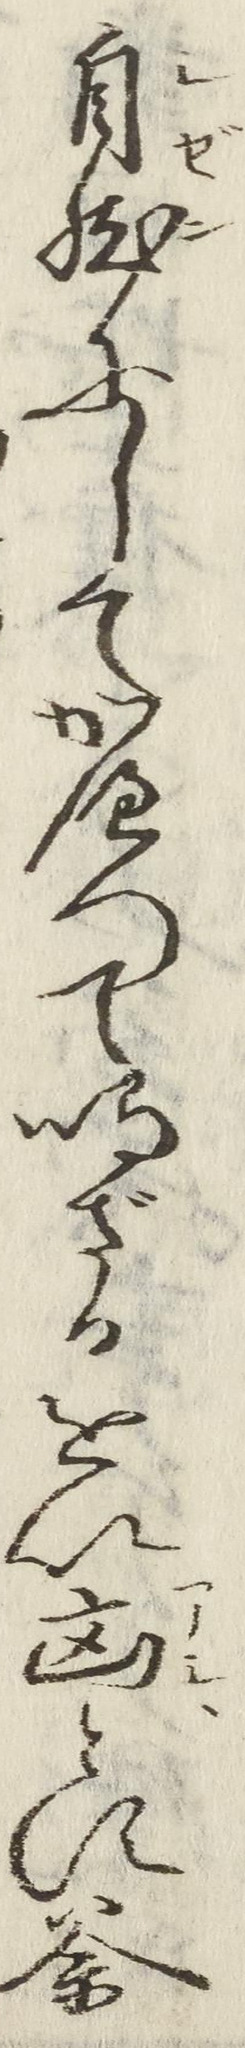自然にしてかへつて鳴ざるを以凶とす釜
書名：天地或問珍　地
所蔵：東京大学地震研究所図書室 Earthquake Research Institute Library, The University of Tokyo, JAPAN
